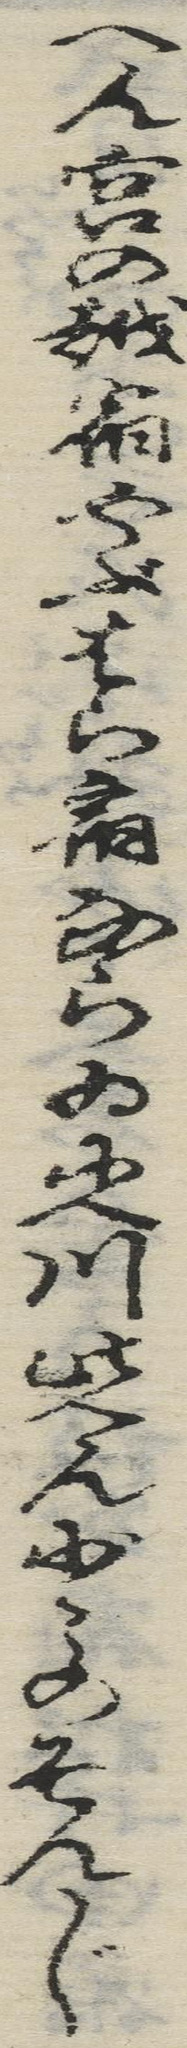へん宮の越宿やぶはら宿ならゐにへ川此へん少々のそんじ
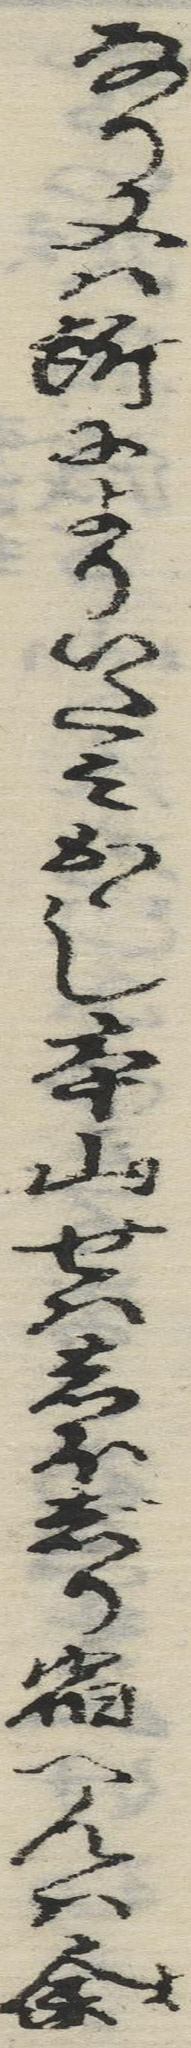なり又は所によりいたみおゝし本山せはしほじり宿へんは余
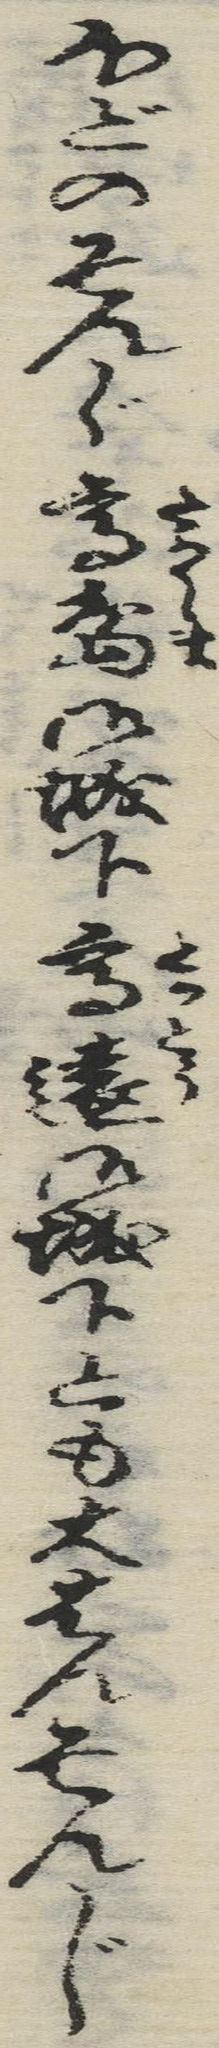ほどのそんじ高島御城下高遠御城下とも大はんそんじ
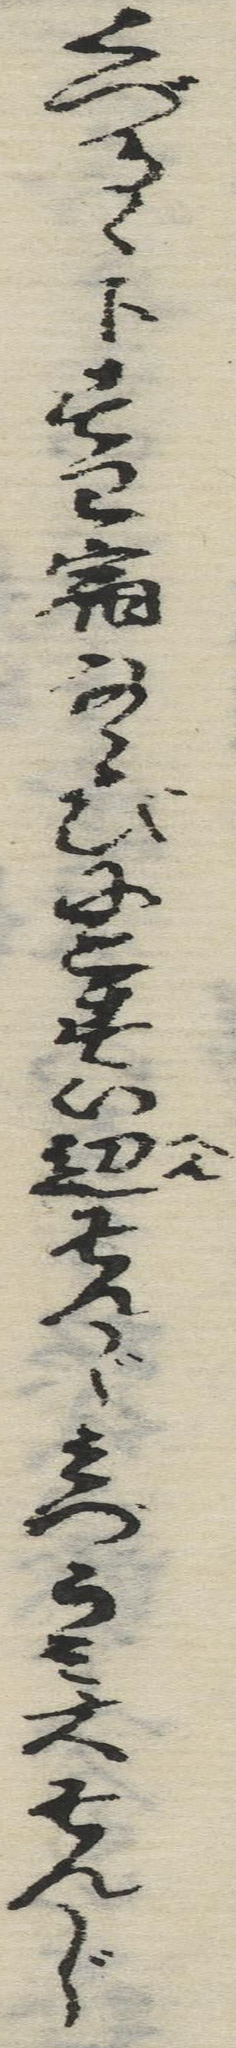くづるゝ下すわ宿ならびにこすい辺そんじみつう？み大そんじ
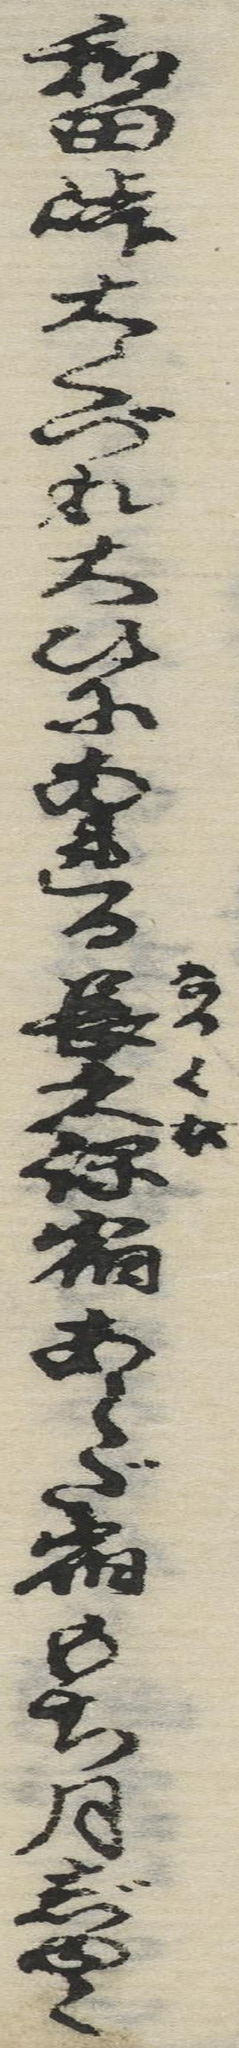和田峠大くづれ大ひにあれる長久保宿あしだ宿もち月じゆく
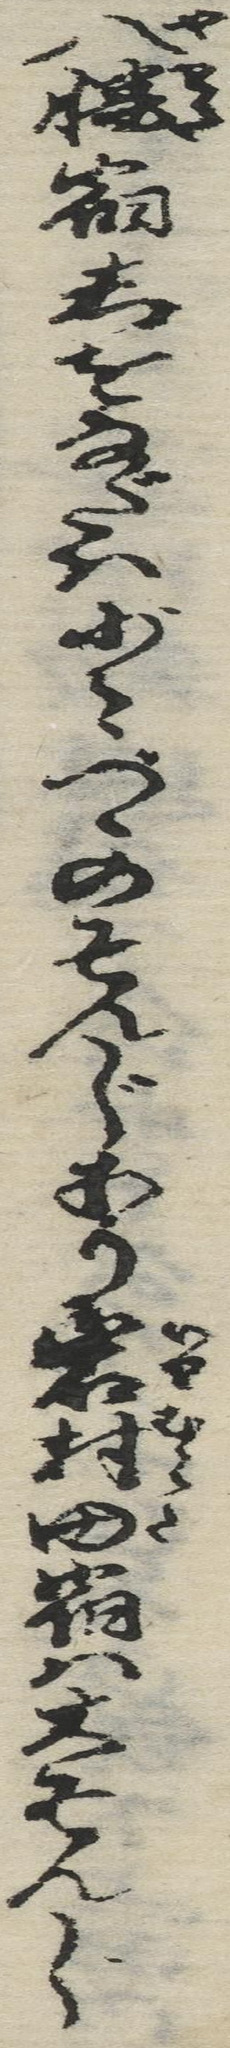八幡宿しをなだは少々づゝのそんじあり岩村田宿は大そんじ

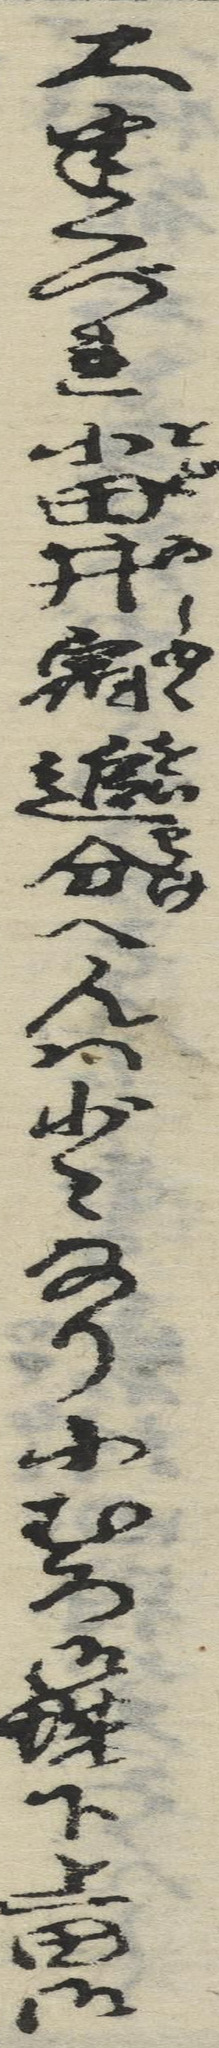大半くづれ小田井宿追分へんは少々なり小むろ御子城下上田御
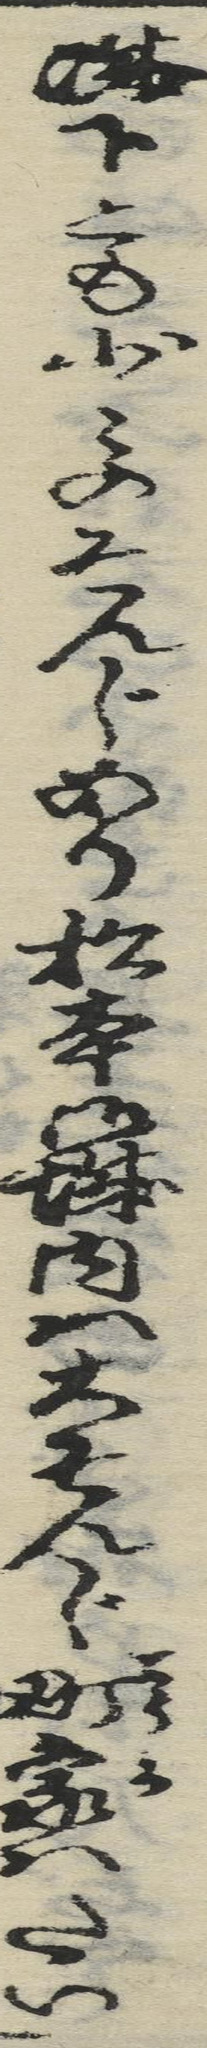城下とも少々のそんじあり松本御城内は大そんじ町家はたい
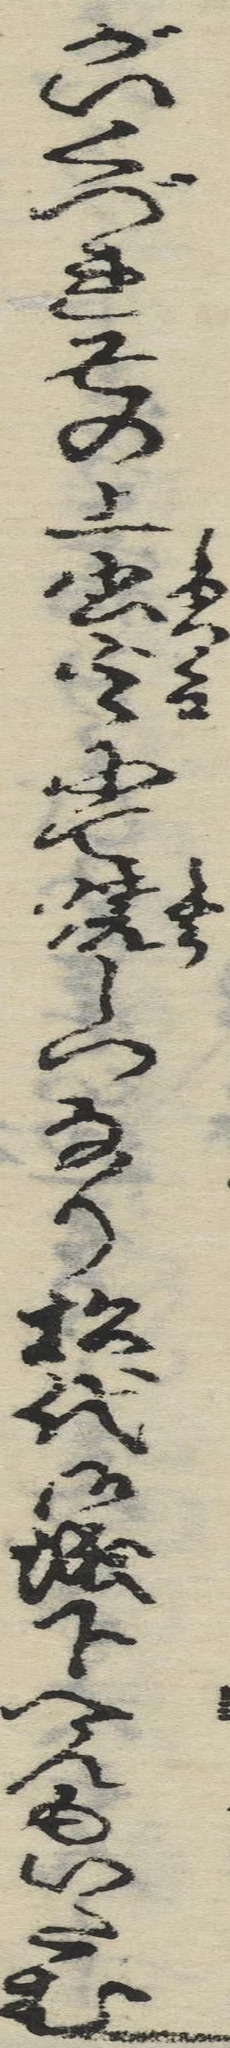がいくづれその上出炎にて焼しつなり松代御城下へんもいたむ
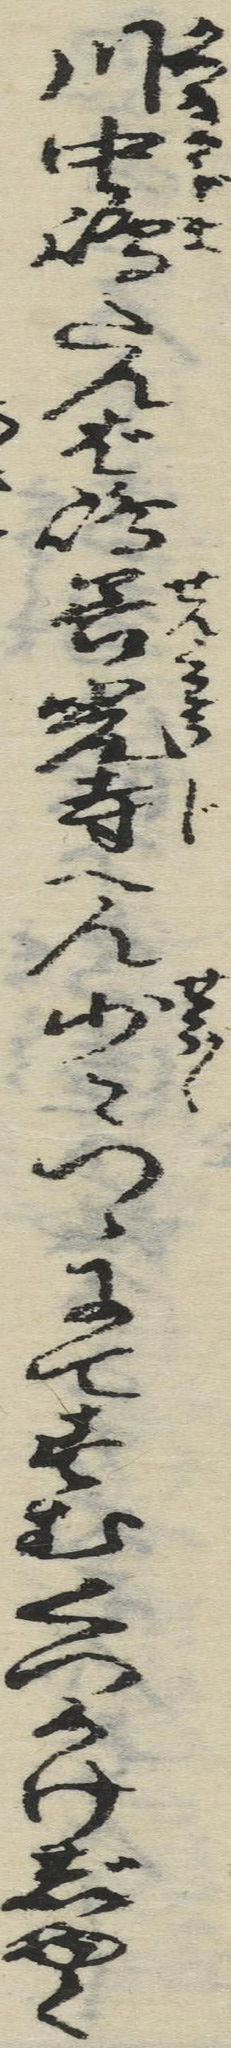川中嶋たんば嶋善光寺へん少々つゝにてすむくつかけじゆく
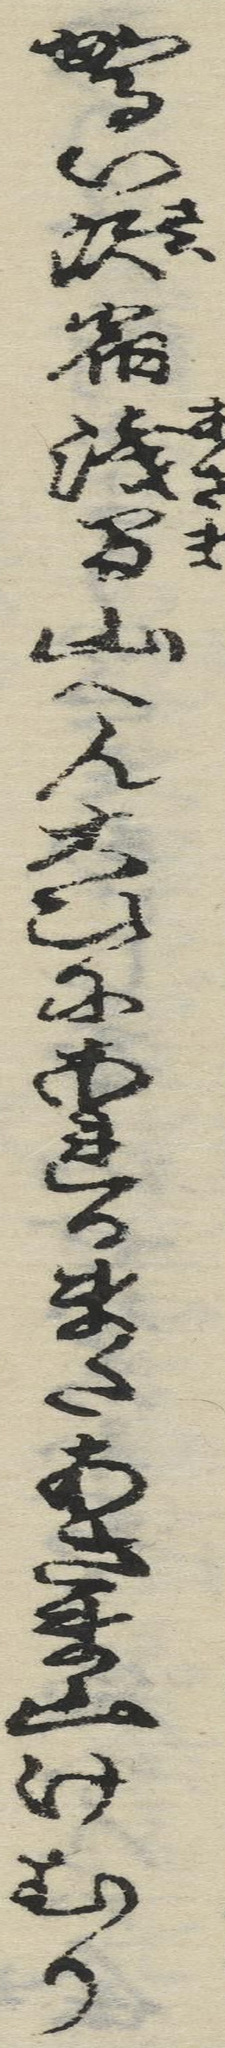かるい沢宿浅間山へん大ひにあれるまたあさま山けむり
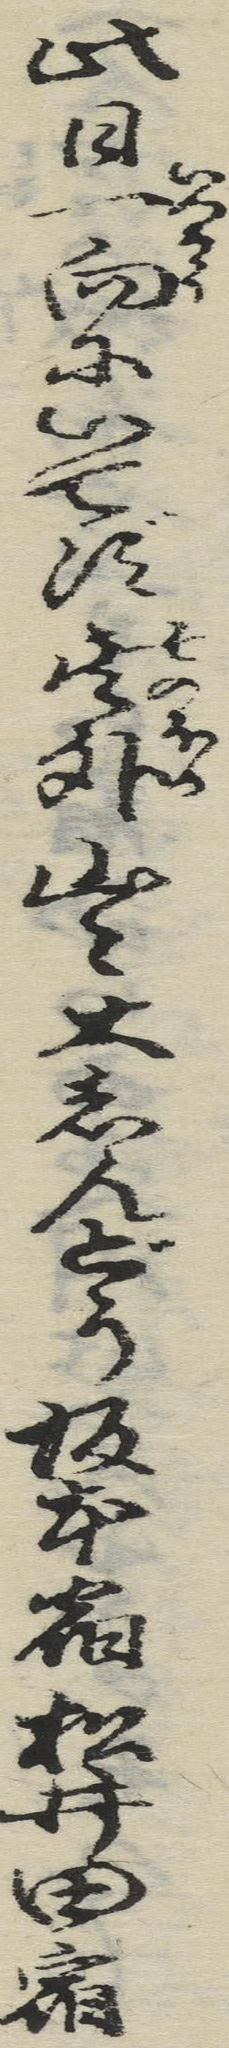此日一向にいてず其外山々大しんどう坂本宿松井田宿
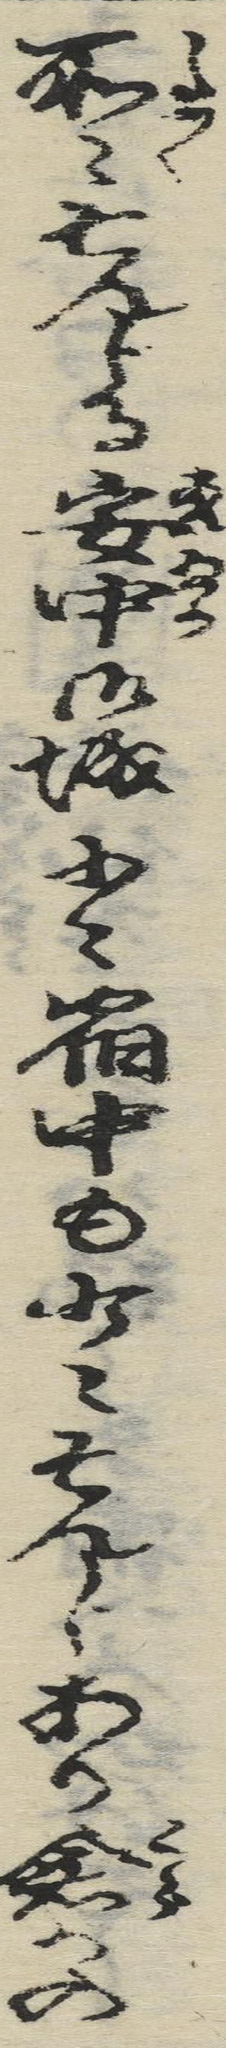所々そんじる安中御城少々宿中も少々そんじあり倉かの
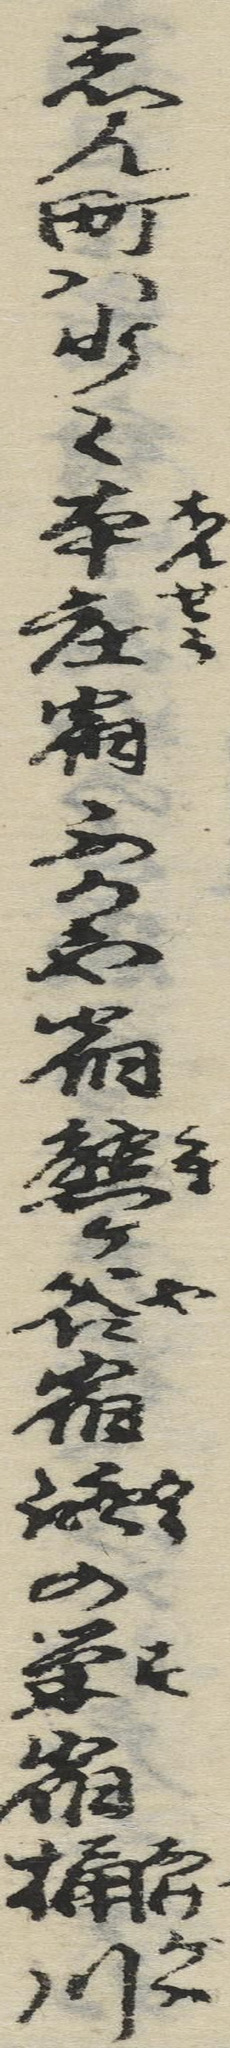しん町は少々本庄宿ふかや宿熊ケ谷宿鴻の巣宿桶川
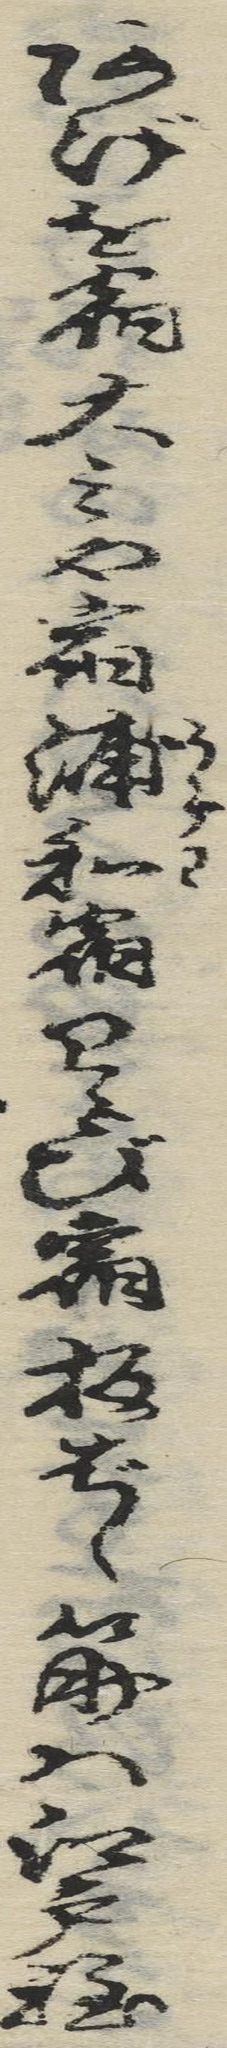あげを宿大みや宿浦和宿わらび宿板ばし筋は江戸程
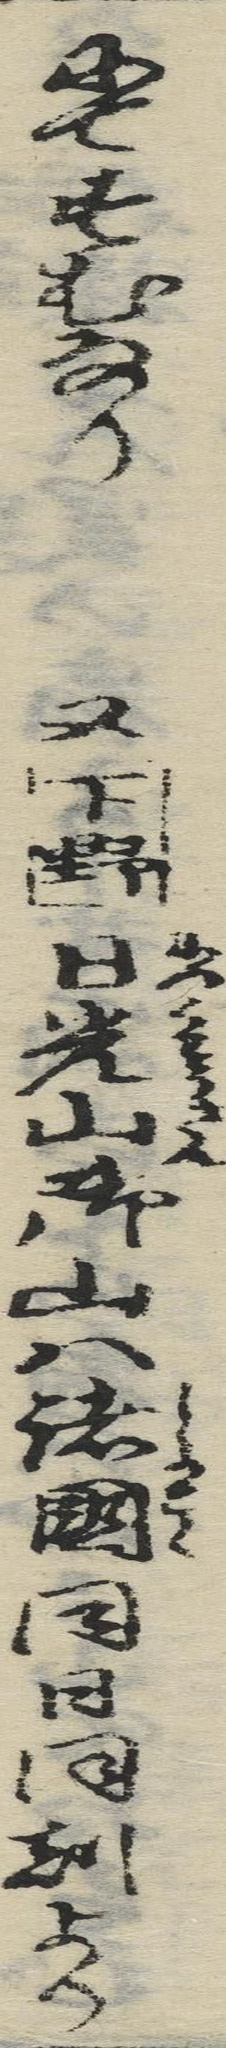にてすむなり又下野日光山御山は諸国同日同刻より
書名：諸国海辺地震津波書
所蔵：東京大学地震研究所図書室 Earthquake Research Institute Library, The University of Tokyo, JAPAN
